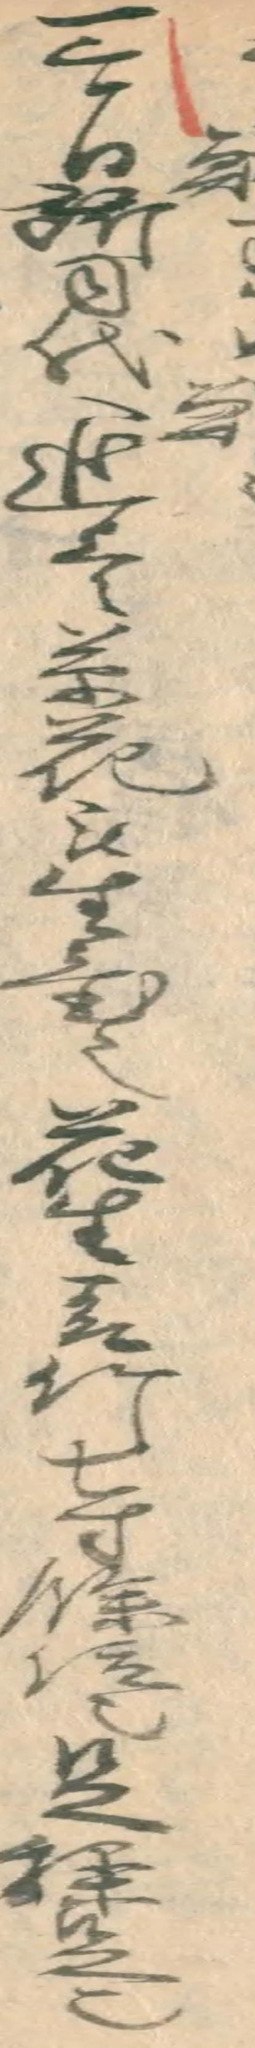一今日所司代へ進上之草花被生置之花生青竹七寸余位也足操足也
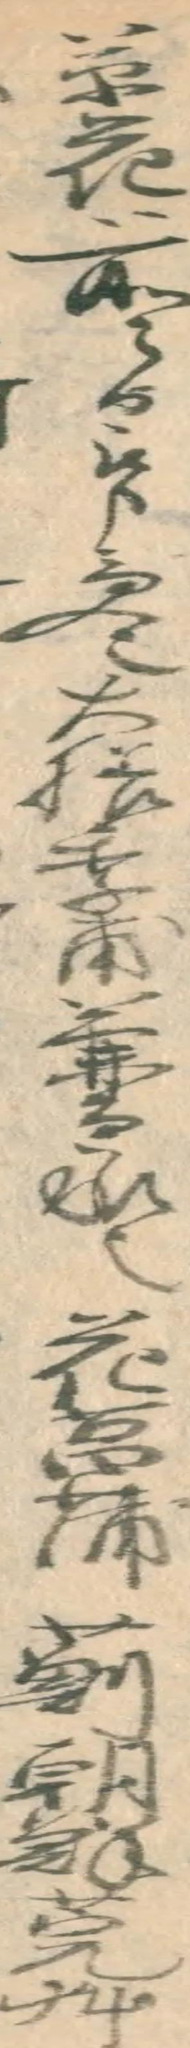草花ハ所々ゟ被申受也大膳季甫兼而承之花菖蒲薊朝鮮莞艸
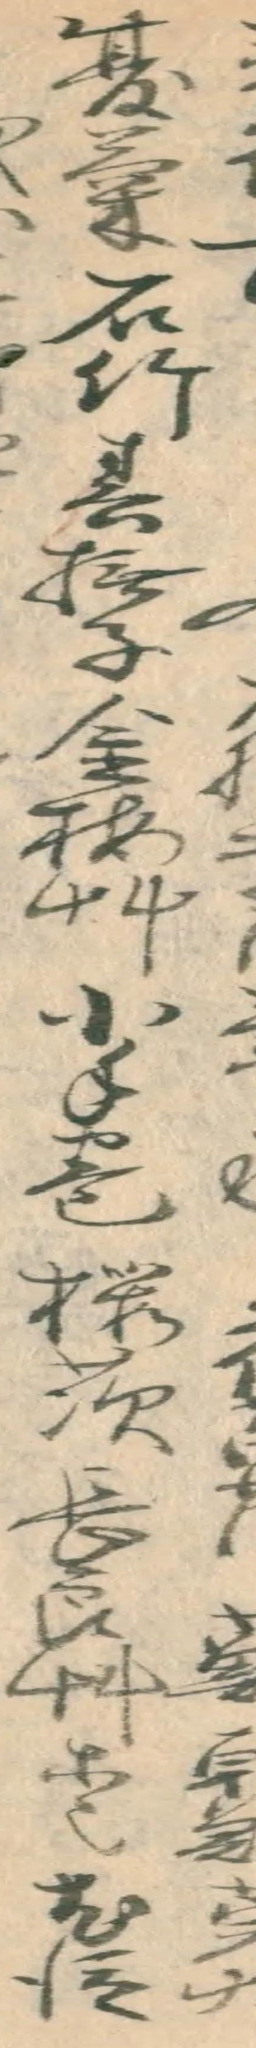夏菊石竹春撫子金梅草小手巻桜茨長良艸等也尤従
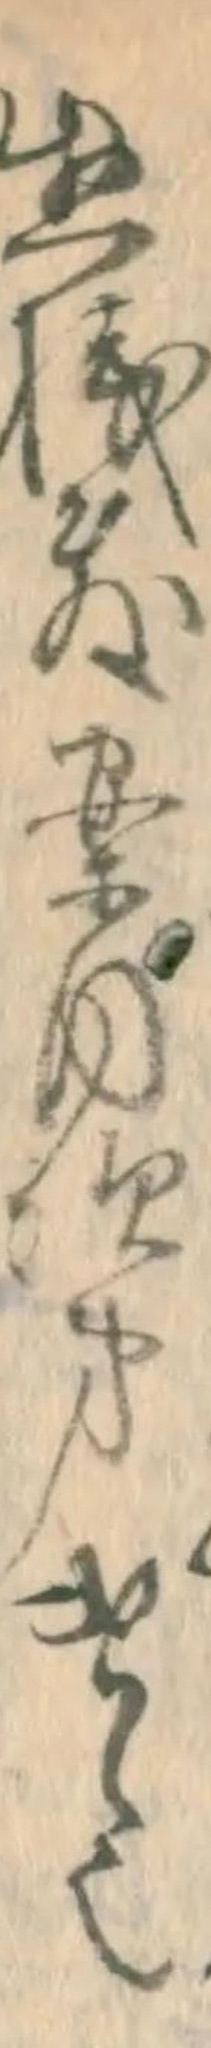惣桟敷案内次第遣候也
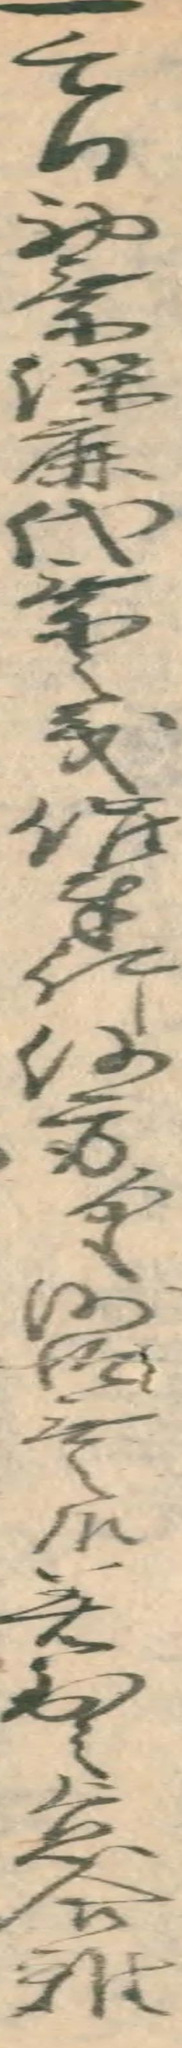一今日初乗保鹿代乗之義催奉行何方ゟも沙汰無之故着到之点合難
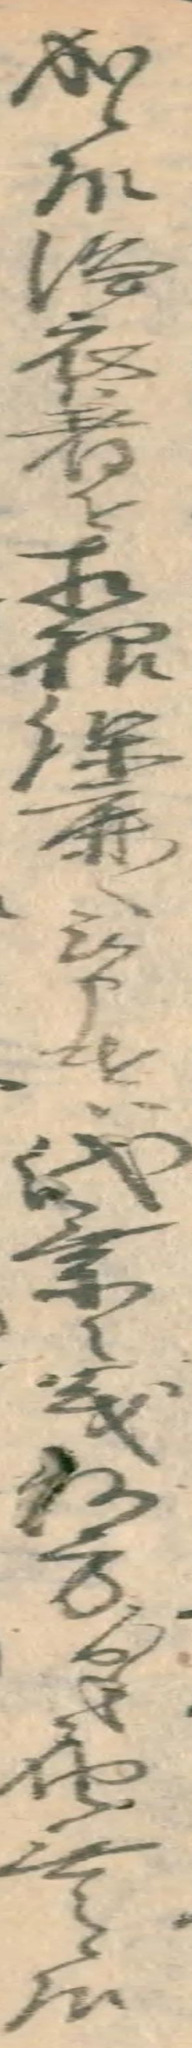成候故浄衣者を相招保鹿へ被申遣ハ代乗之義何方ゟも届無之候故
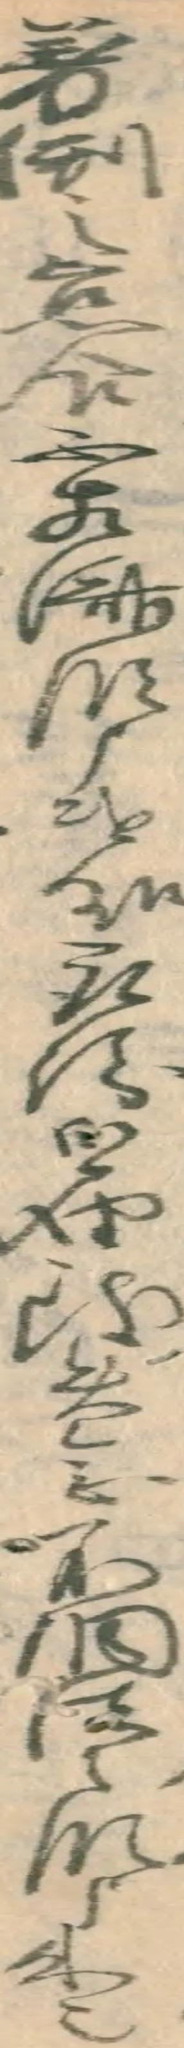着倒之点合不相済段申遣候処取紛御届致失念不調法之段申来也
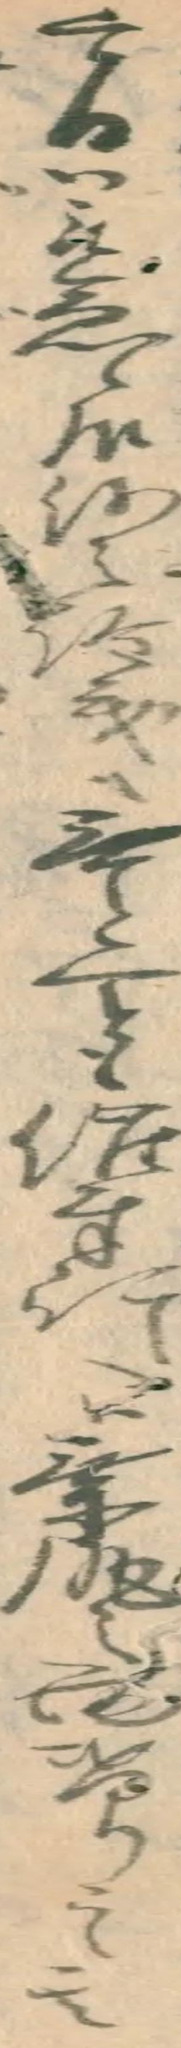今日ハ被急候故何之詮義も無之候へとも催奉行へハ乗尻之替り候ハヽ其
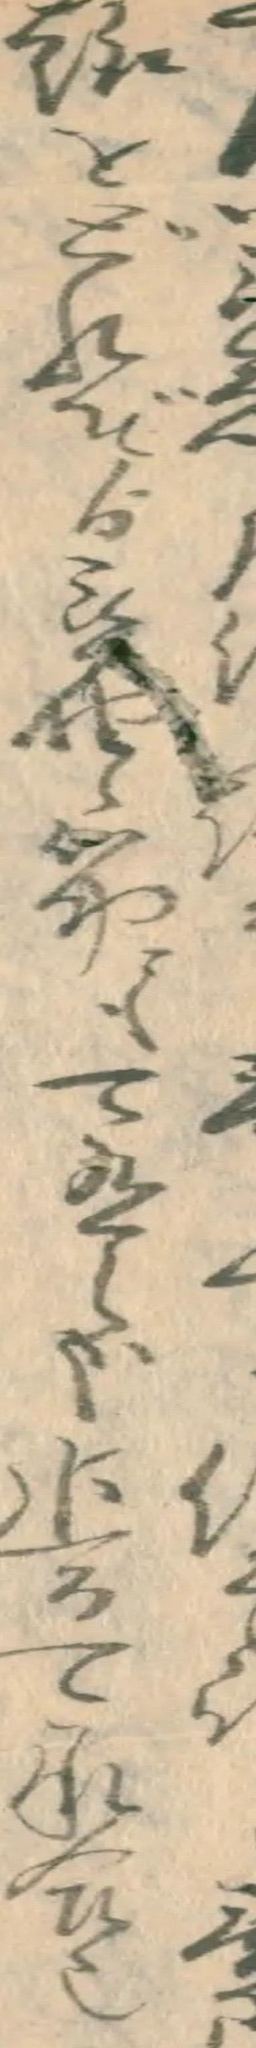趣をどれぞゟ被届候筋ニも可有之哉追而可承合也
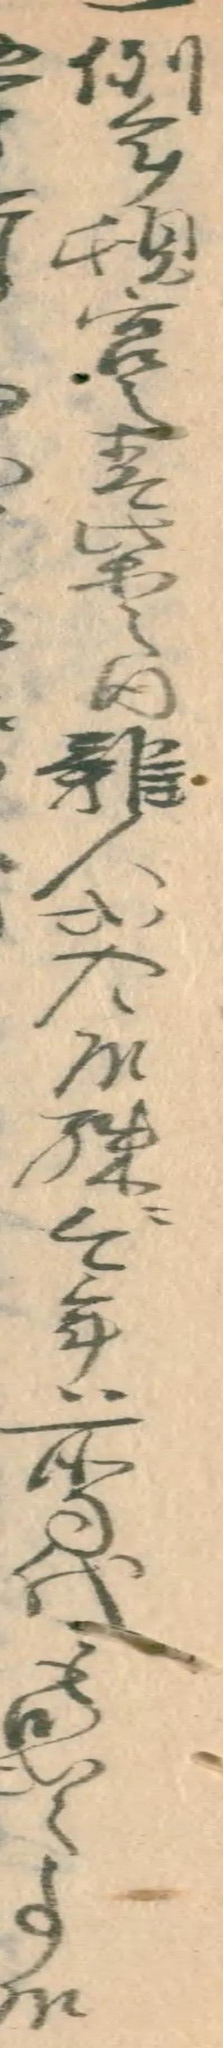一例年頓宮之青柴之内雑人出入候故殊ニ今年ハ所司代も御出之事故
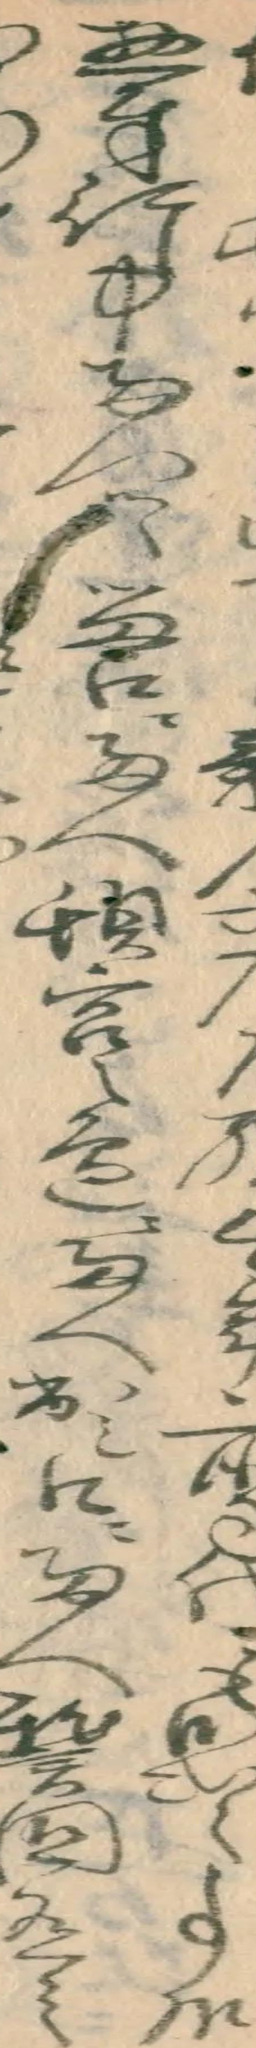惣奉行中両人ツヽ留口ニ両人頓宮之辺ニ両人出シ口ニ両人諬固有之
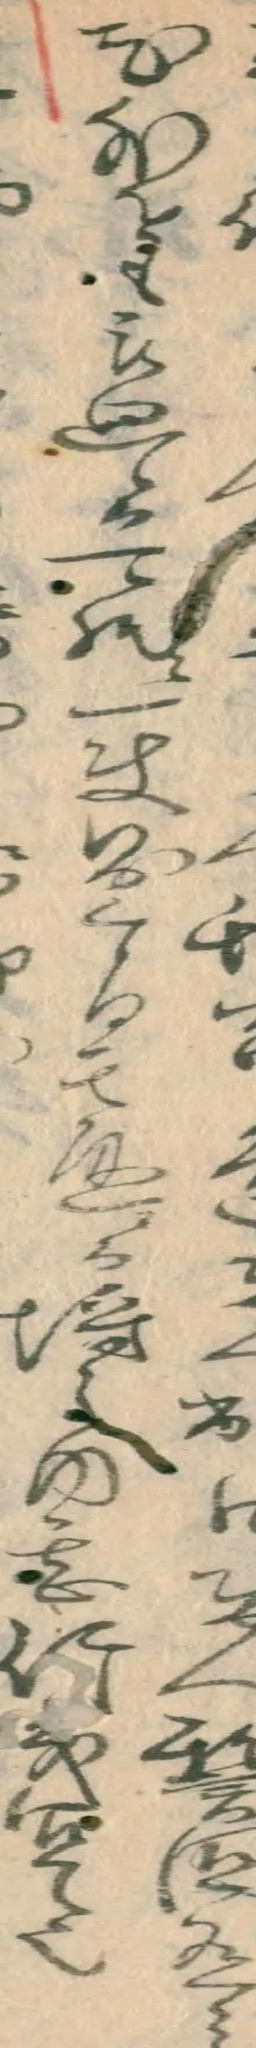尤外をも被廻候而可然ニ一決則今日其通ニ而埒之内甚行義宜候也
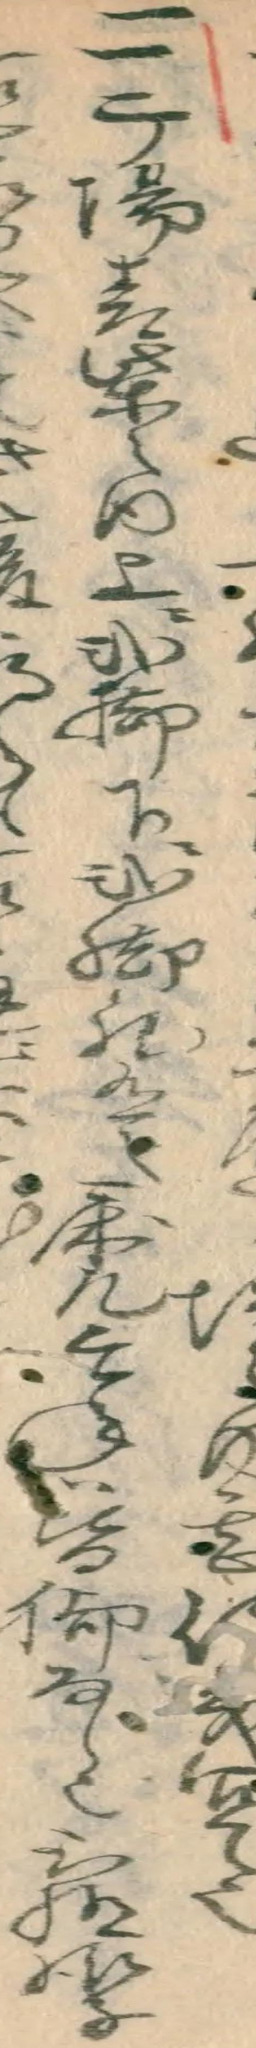一一二ノ場青柴之内上ニ弐脚下ニ弐脚程有之床几今年ハ皆脚なし也至極様子
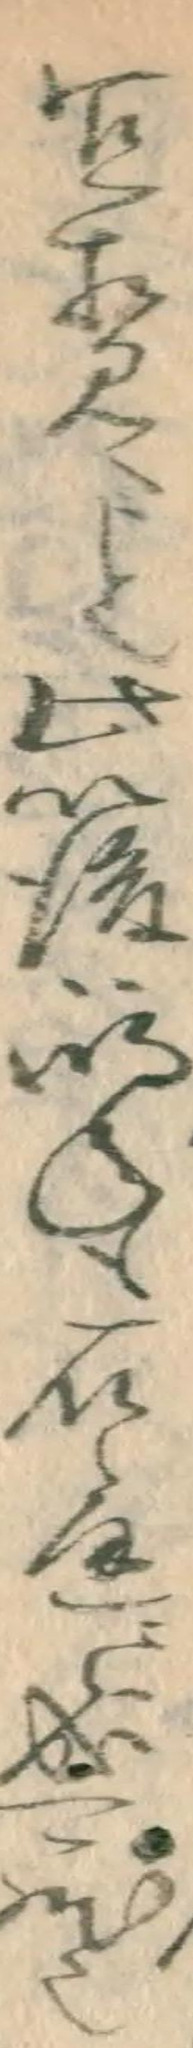宜相見へ申也此以後ハ明年も右之通ニ被成可然也
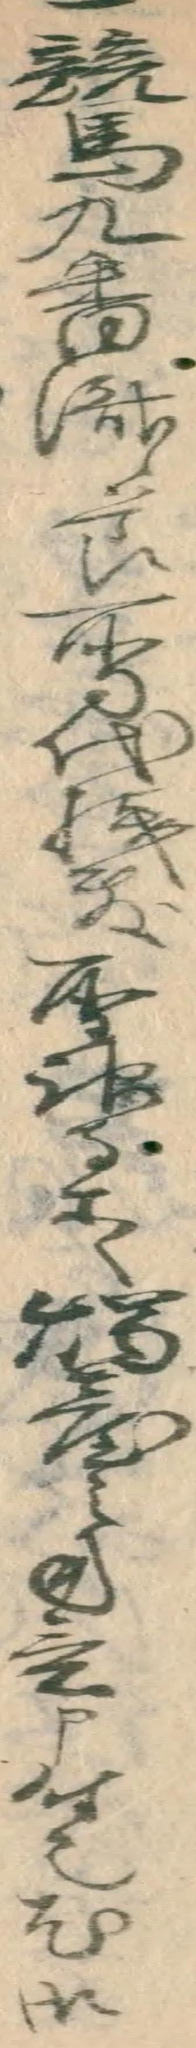一競馬九番済候節所司代桟敷聖神寺等へ燭台之用意申付也尤御
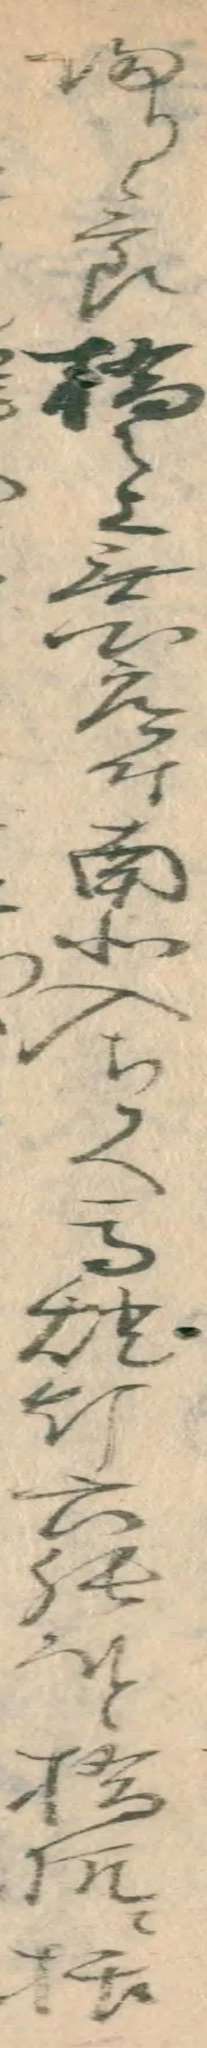帰り候節橋之上無心元ニ付南北入ちかへ高燈灯六張ほと橋杭ニ括
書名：賀茂社記録. 第58冊
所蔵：国立国会図書館 National Diet Library, JAPAN
